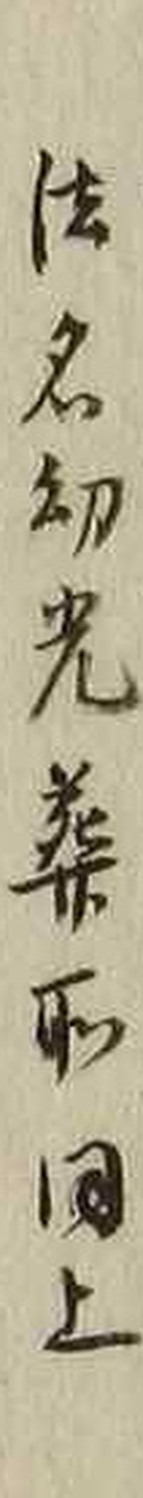法名幼光葬所同上
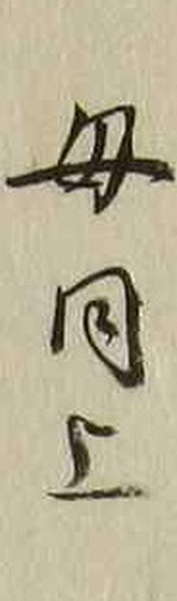母同上
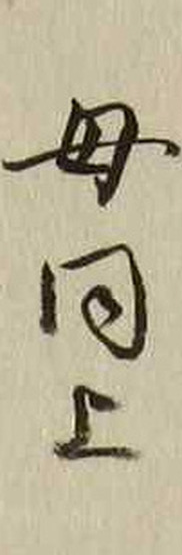母同上
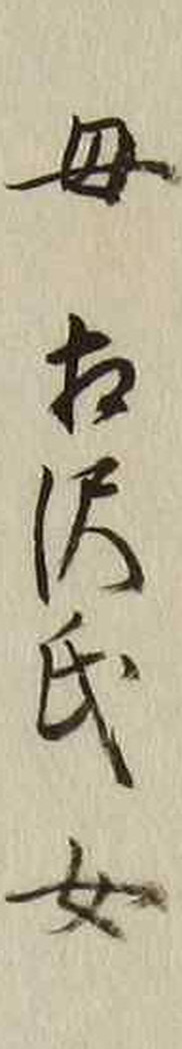母相沢氏女
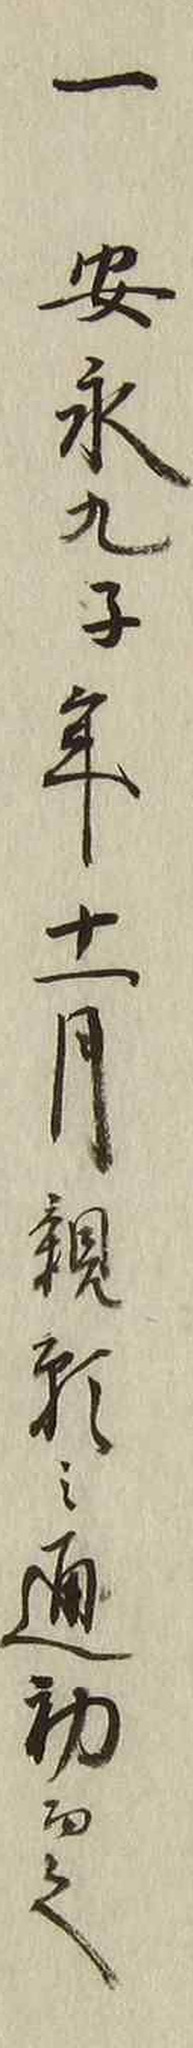一安永九子年十一月親願之通初めて之
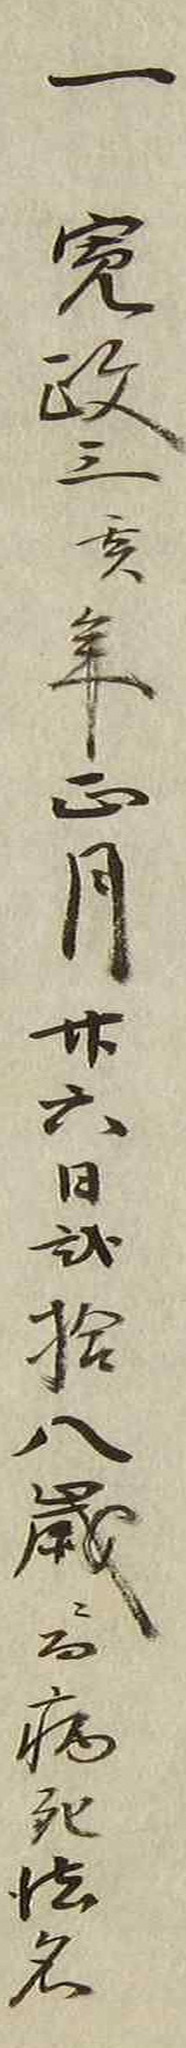一寛政三亥年正月弐拾八歳ニて病死法名
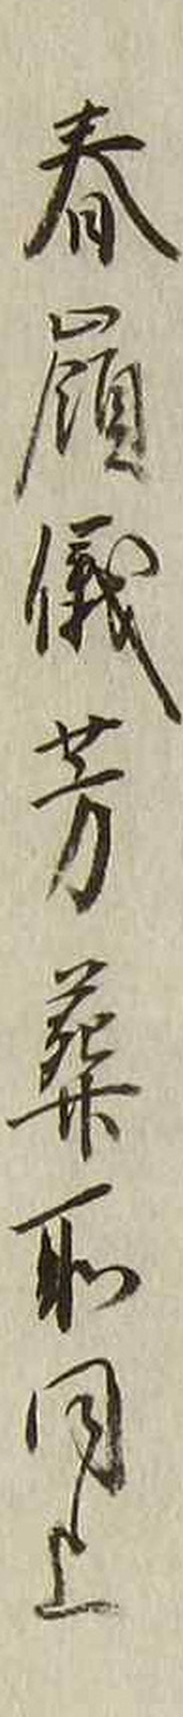春嶺儀芳葬所同上
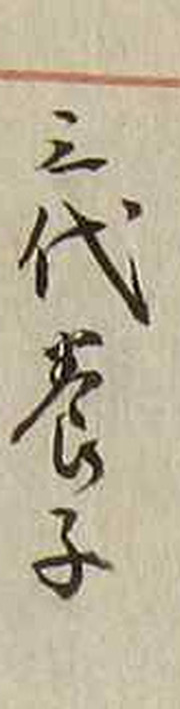三代養子
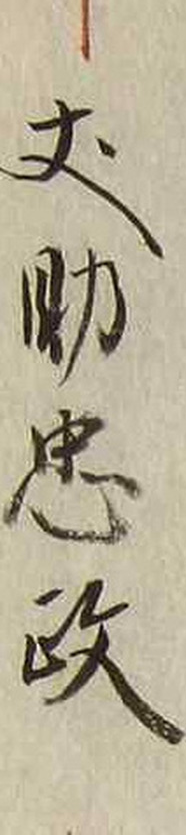丈助忠政
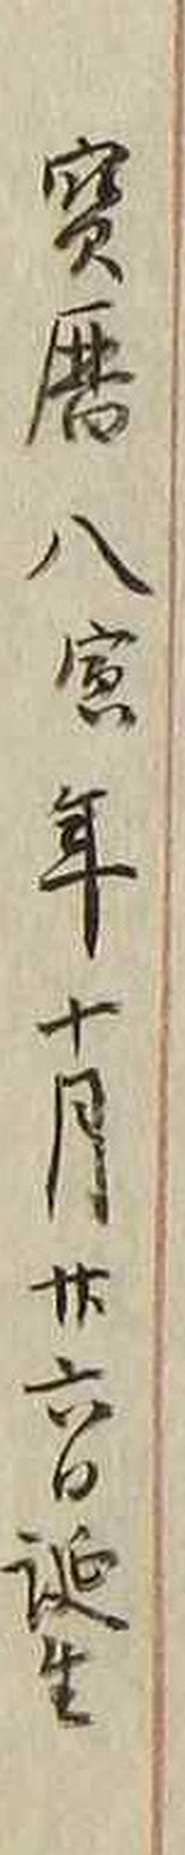宝暦八寅年十月廿六日誕生

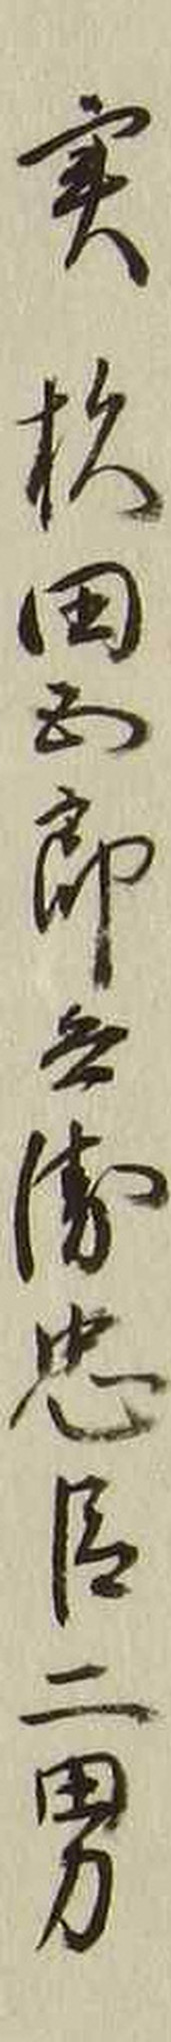実杉田五郎兵衛忠臣二男
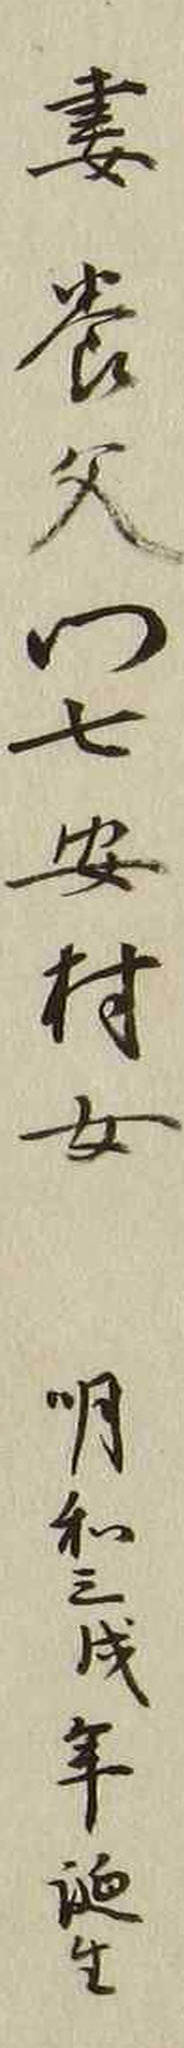妻養父門七安村女明和三戌年誕生
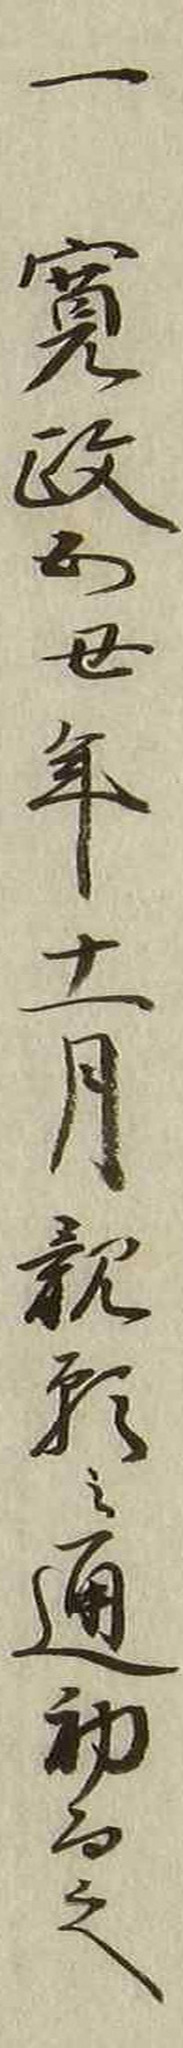一寛政五丑年十一月親願之通初めて之
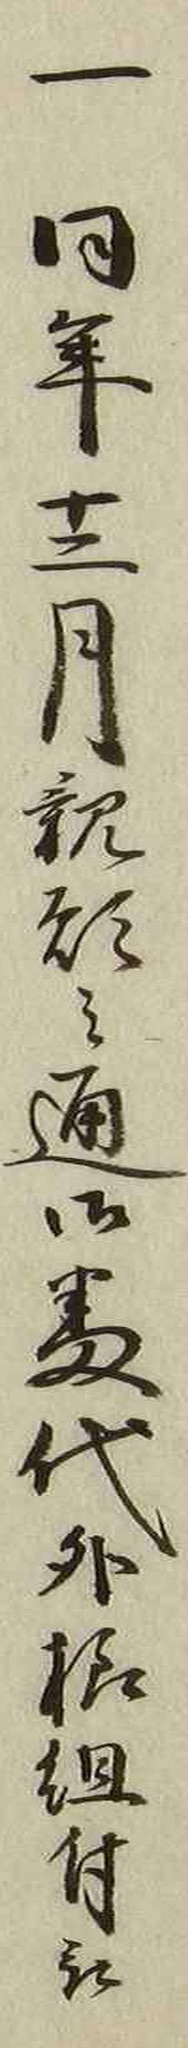一同年十二月親願之通御番代外様組付
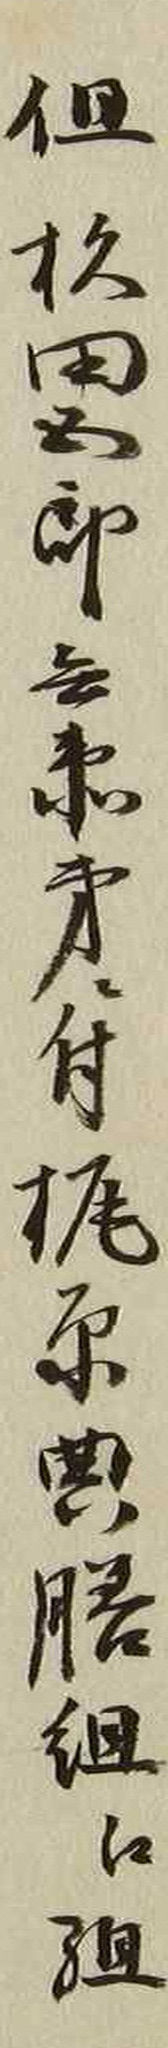但し杉田五郎兵衛弟ニ付梶原典膳組へ組
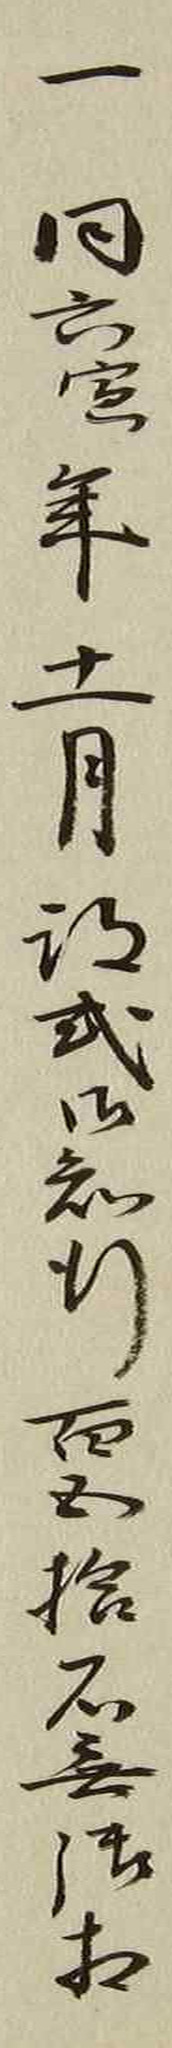一同六寅年十一月跡式御知行百五拾石御相違無く
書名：諸士系譜　巻之19　い之部19
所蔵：会津若松市立会津図書館
